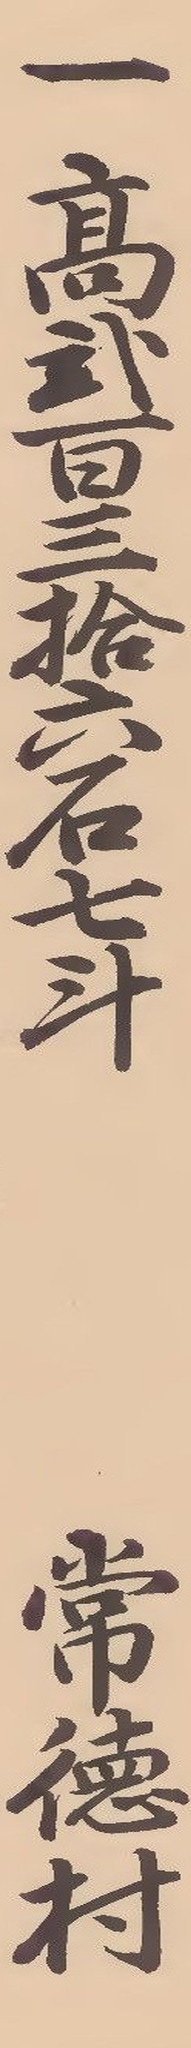一高弐百三拾六石七斗常徳村
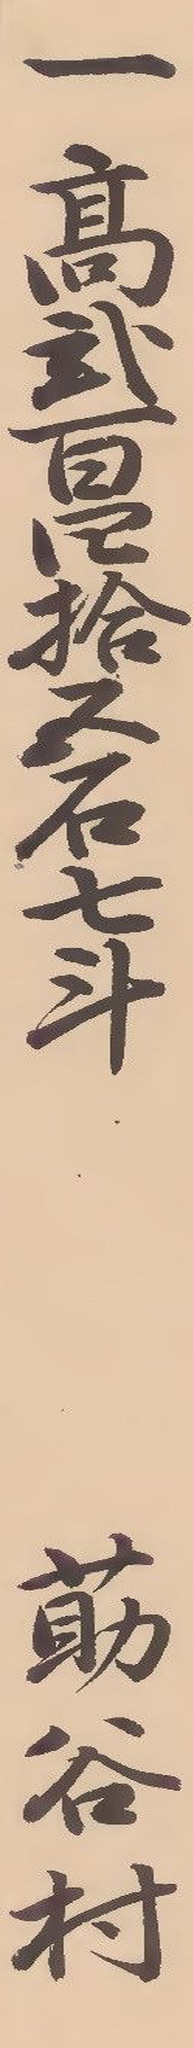一高弐百四拾五石七斗莇谷村
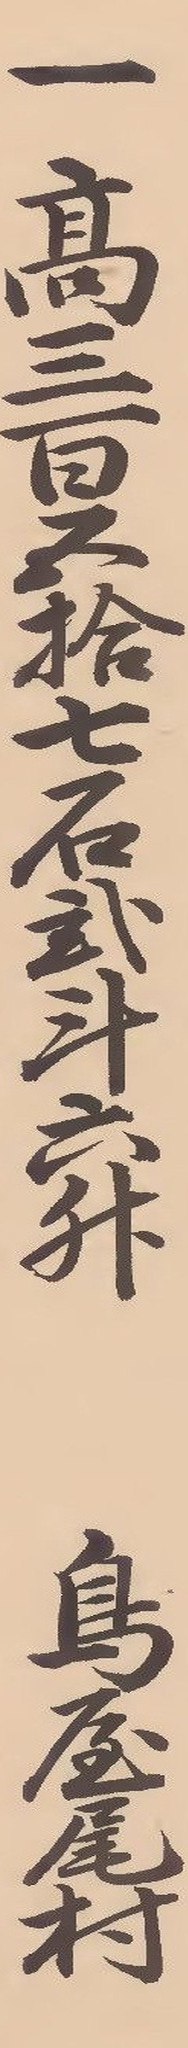一高三百五拾七石弐斗六升鳥屋尾村
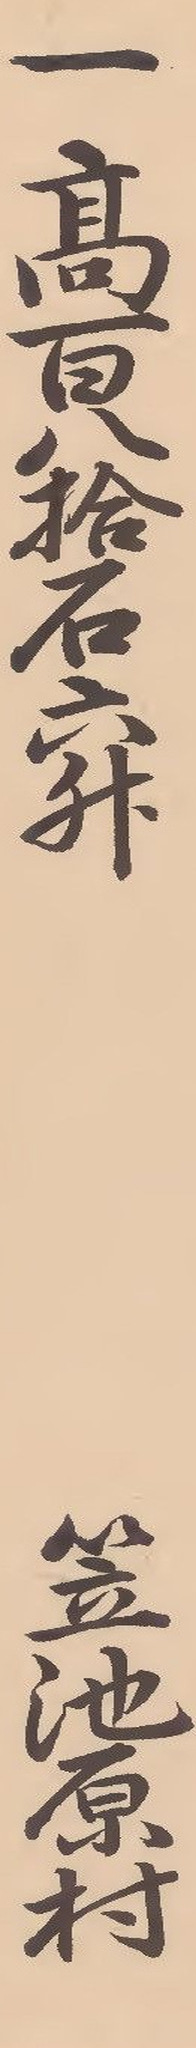一高百八拾石六升笠池原村

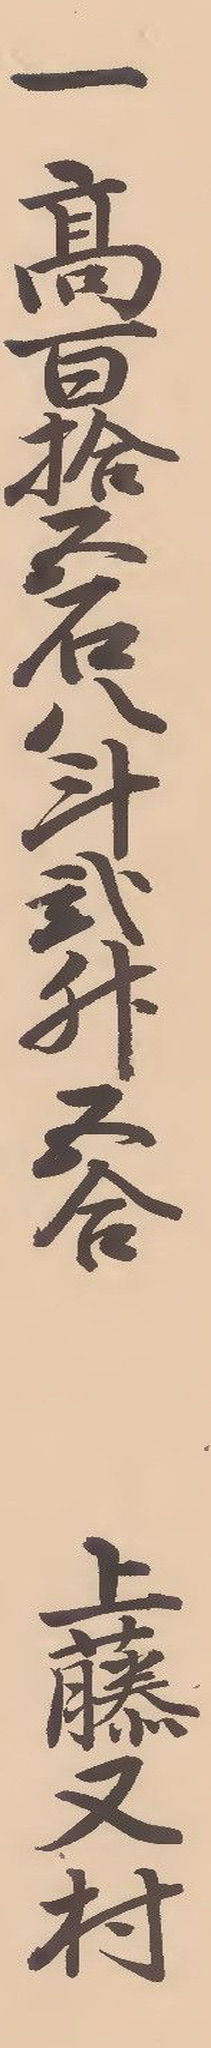一高百拾五石八斗弐升五合上藤又村
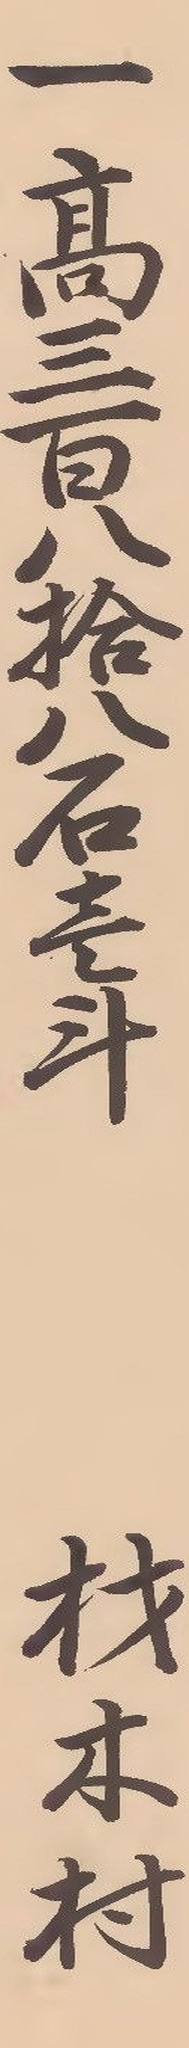一高三百八拾八石壱斗材木村
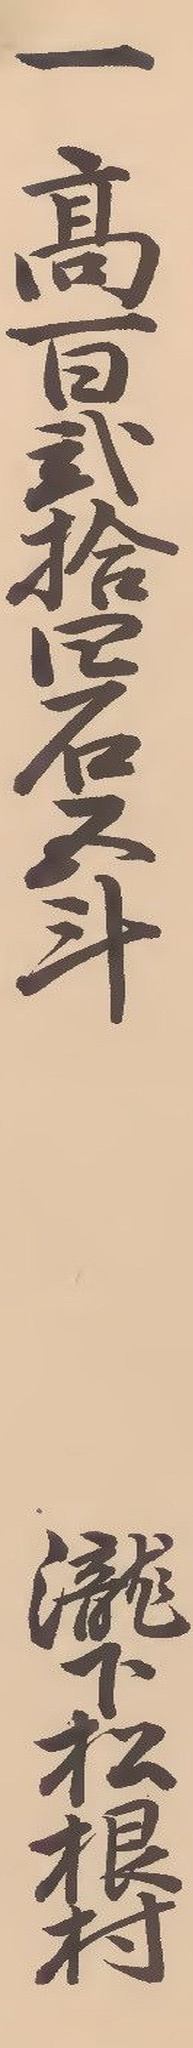一高百弐拾四石五斗滝下松根村
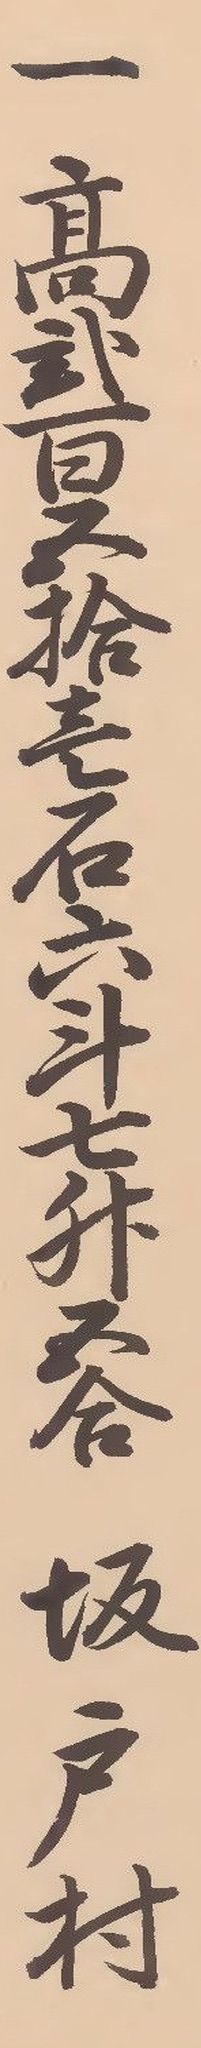一高弐百五拾壱石六斗七升五合坂戸村

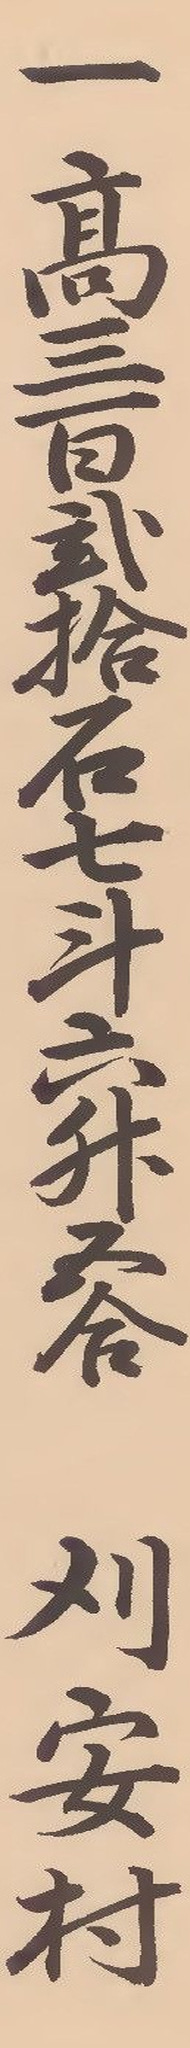一高三百弐拾石七斗六升五合刈安村
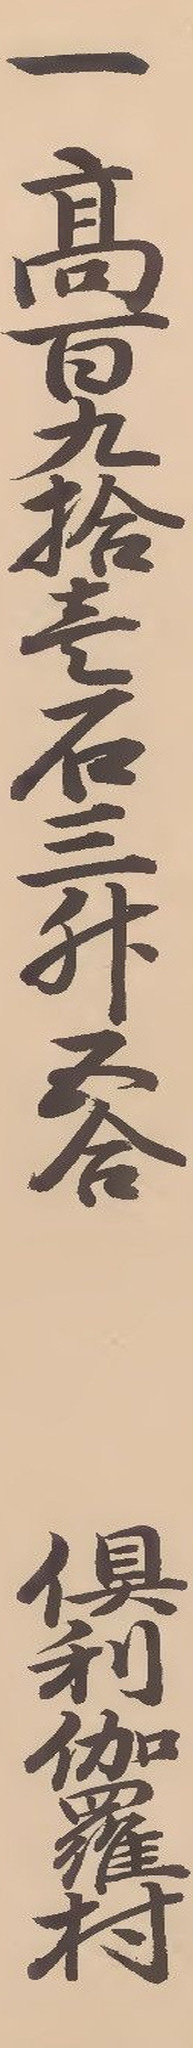一高百九拾壱石三升五合倶利伽羅村
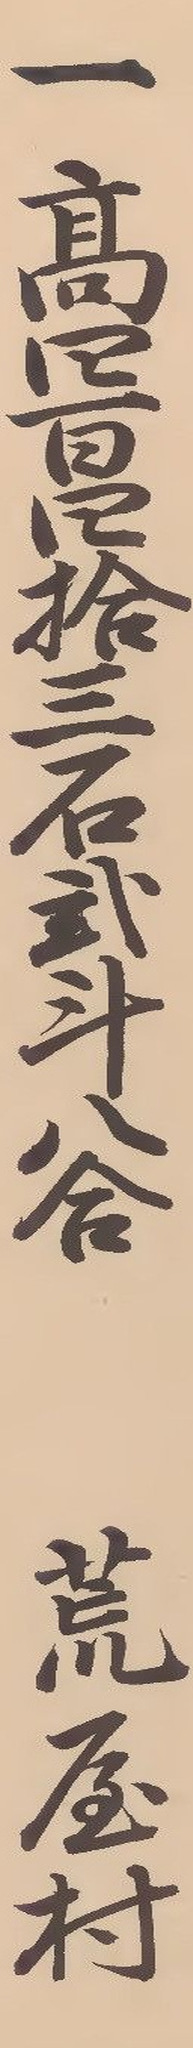一高四百四拾三石弐斗八合荒屋村
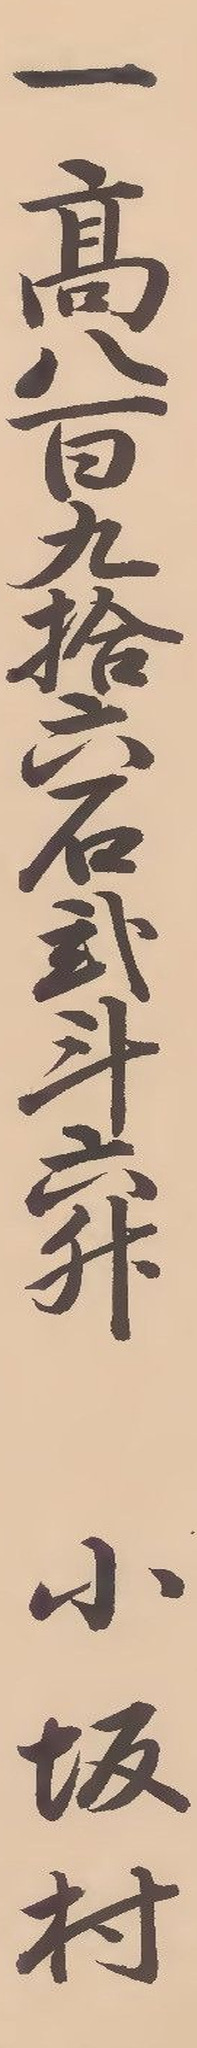一高八百九拾六石弐斗六升小坂村
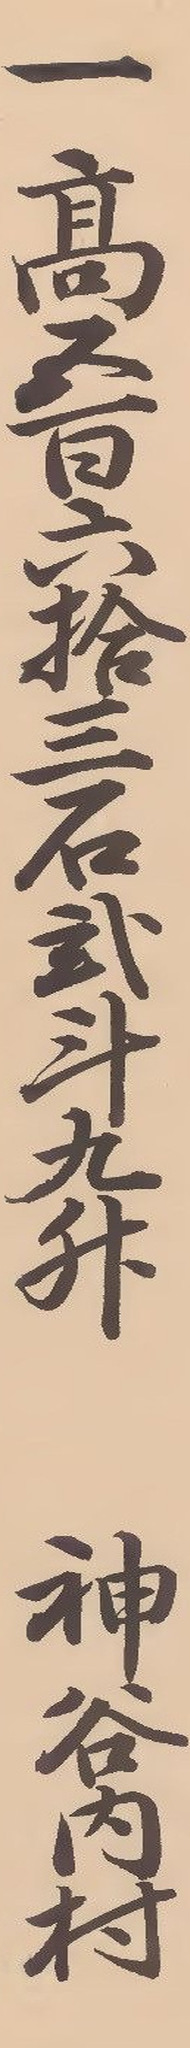一高五百六拾三石弐斗九升神谷内村

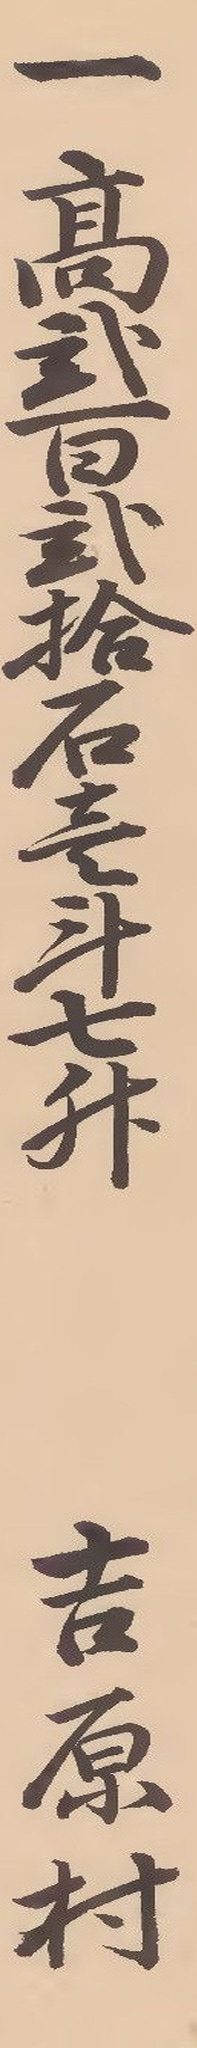一高弐百弐拾石壱斗七升吉原村
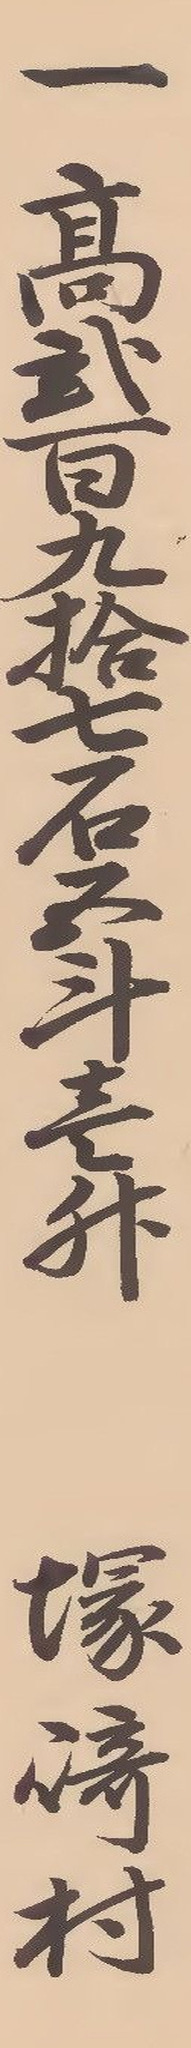一高弐百九拾七石五斗壱升塚崎村
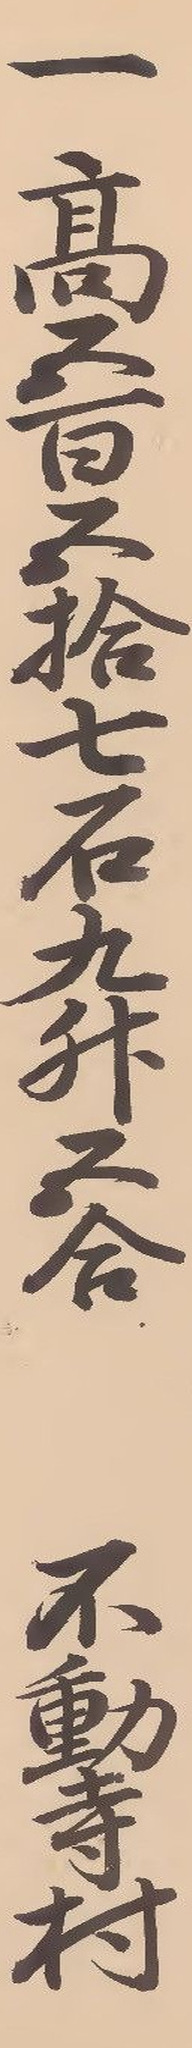一高五百五拾七石九升五合不動寺村
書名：加賀国郷帳
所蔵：国立公文書館 National Archives of Japan
